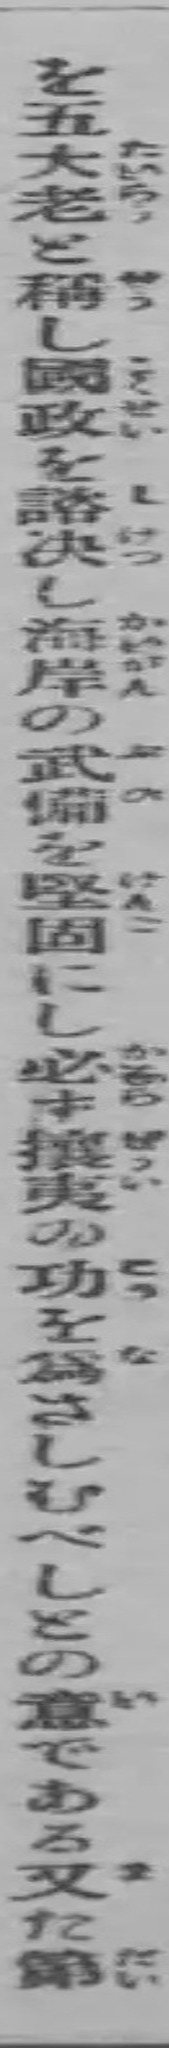を五大老と称し国政を諮決し海岸の武備を堅固にし必ず攘夷の功を為さしむべしとの意である又た第
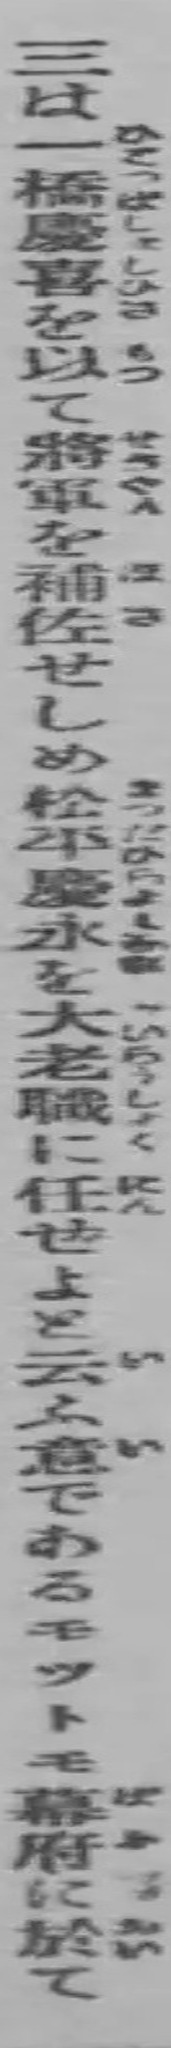三は一橋慶喜を以て将軍を補佐せしめ松平慶永を大老職に任ぜよと云ふ意であるモツトモ幕府に於て
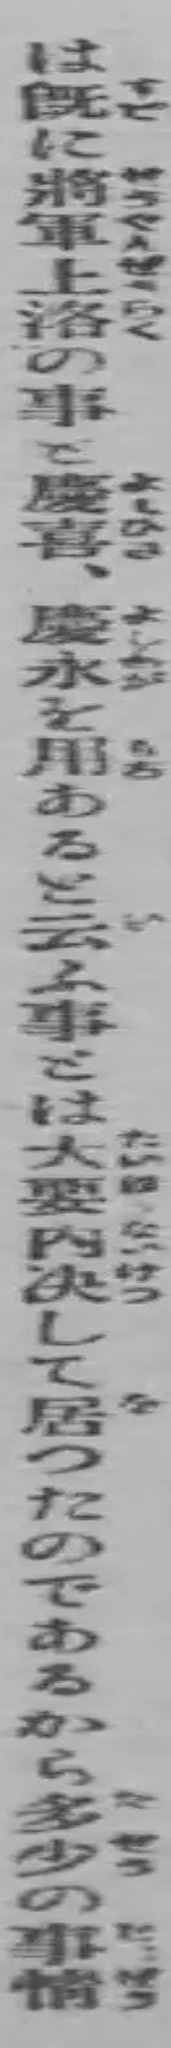は既に将軍上洛の事と慶喜、慶永を用あると云ふ事とは大要内決して居つたのであるから多少の事情
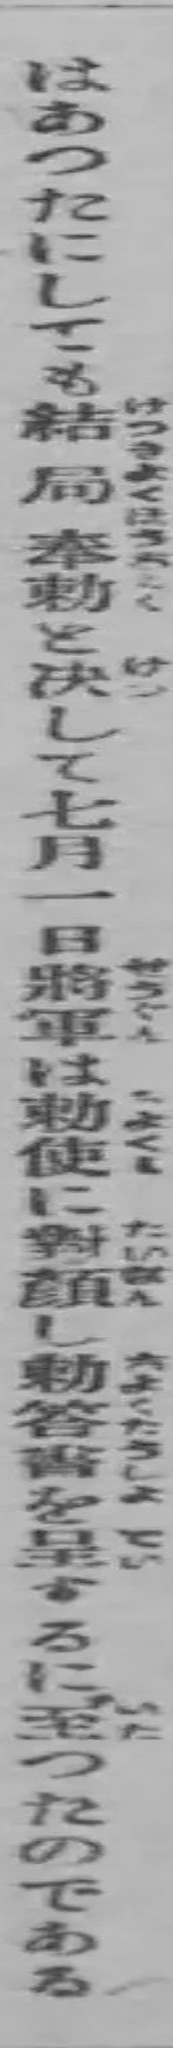はあつたにしても結局奉勅と決して七月一日将軍は勅使に対顔し勅答書を呈するに至つたのである
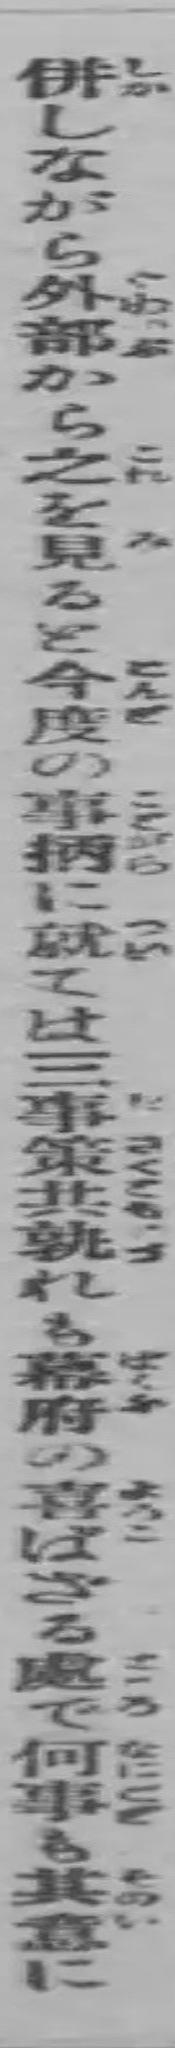併しながら外部から之を見ると今度の事柄に就ては三事策共孰れも幕府の喜ばざる処で何事も其意に
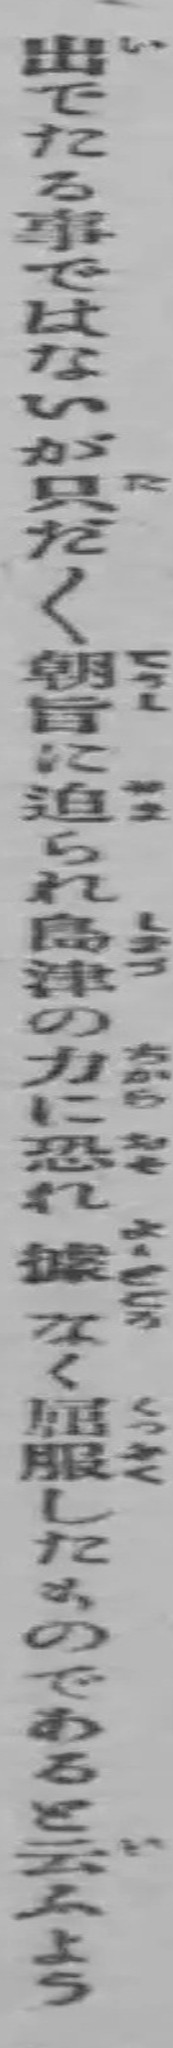出でたる事ではないが只だ〳〵朝旨に迫られ島津の力に恐れ拠なく屈服したものであると云ふよう
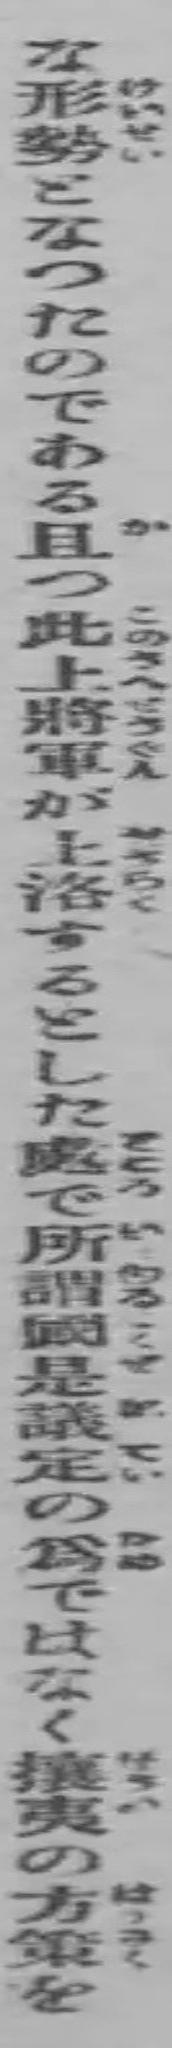な形勢となつたのである且つ此上将軍が上洛するとした処で所謂国是議定の為ではなく攘夷の方策を
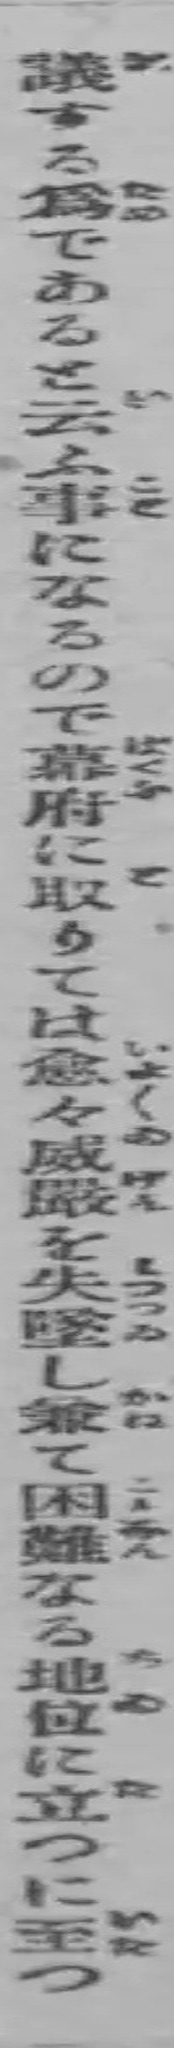議する為であると云ふ事になるので幕府に取りては愈々威厳を失墜し兼て困難なる地位に立つに至つ
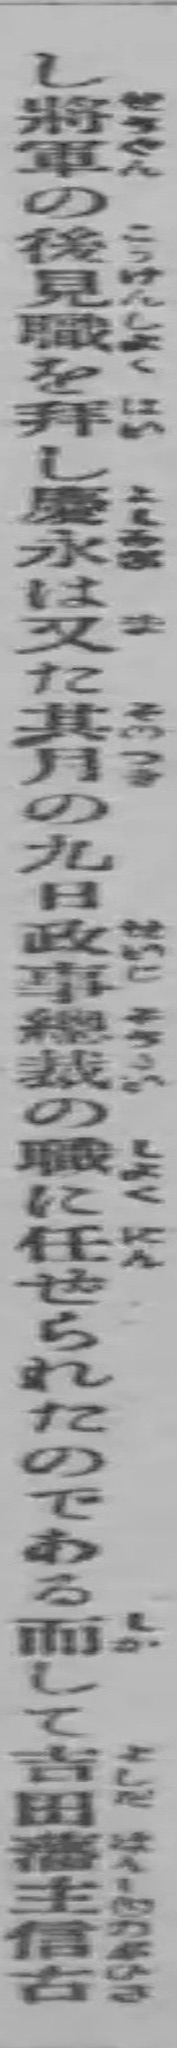し将軍の後見職を拝し慶永は又た其月の九日政事総裁の職に任ぜられたのである而して吉田藩主信古
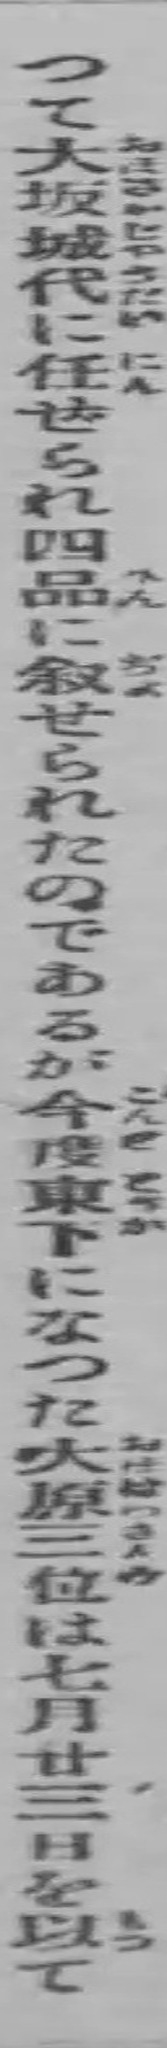つて大坂城代に任ぜられ四品に叙せられたのであるが今度東下になつた大原三位は七月廿三日を以て
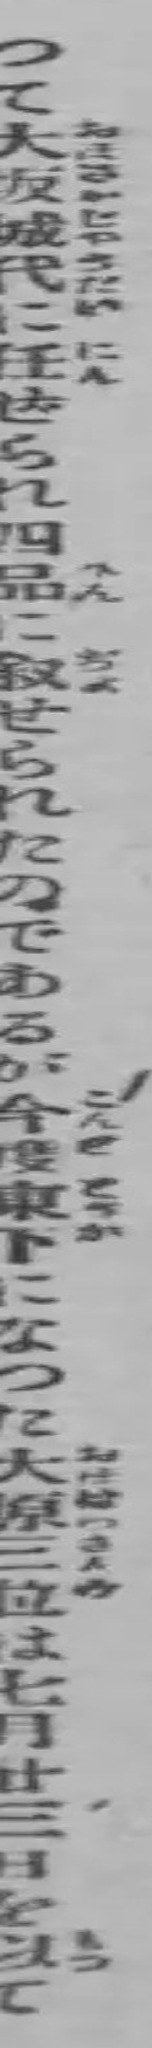つて大坂城代に任ぜられ四品に叙せられたのであるが今度東下になつた大原三位は七月廿三日を以て
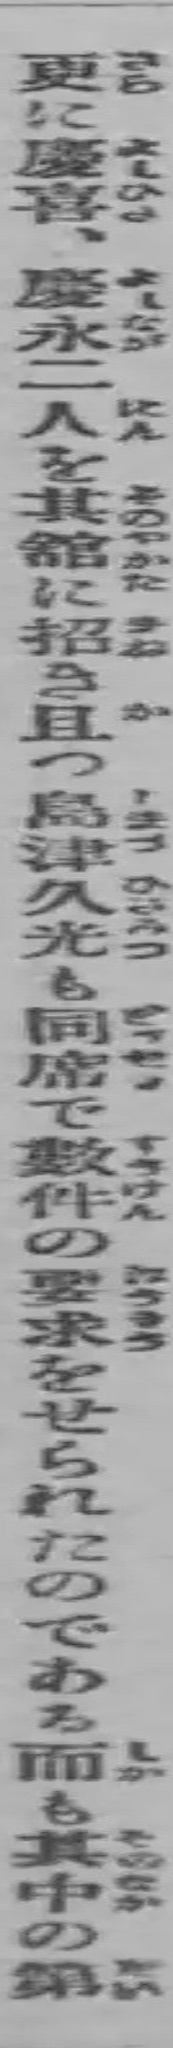更に慶喜、慶永二人を其館に招き且つ島津久光も同席で数件の要求をせられたのである而も其中の第
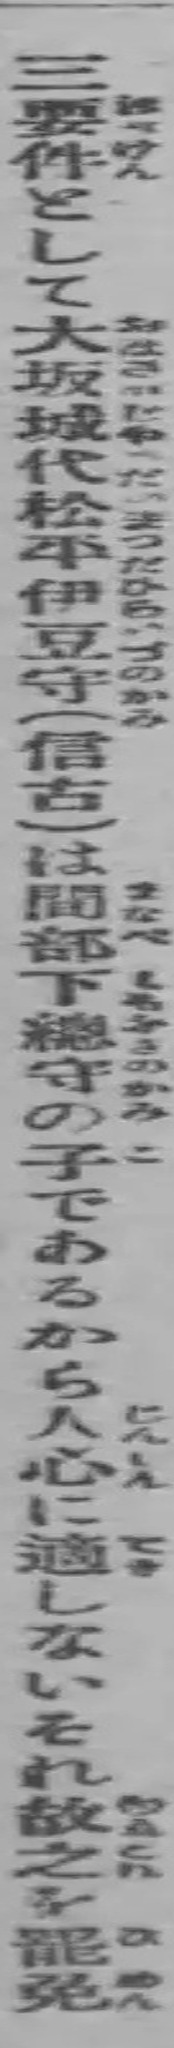三要件として大坂城代松平伊豆守(信古)は間部下総守の子であるから人心に適しないそれ故之を罷免

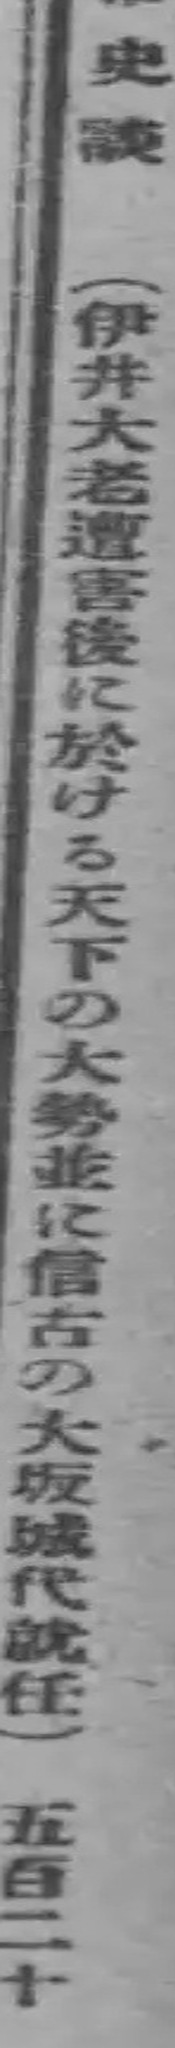豊橋市史談(井伊大老遭害後に於ける天下の大勢並に信古の大坂城代就任)五百二十
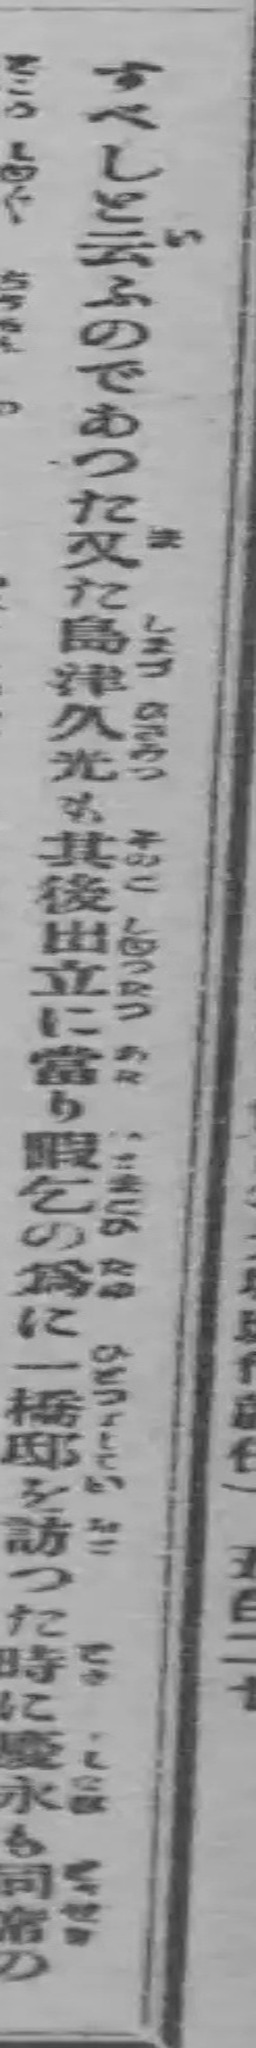すべしと云ふのであつた又た島津久光も其後出立に当り暇乞の為に一橋邸を訪つた時に慶永も同席の
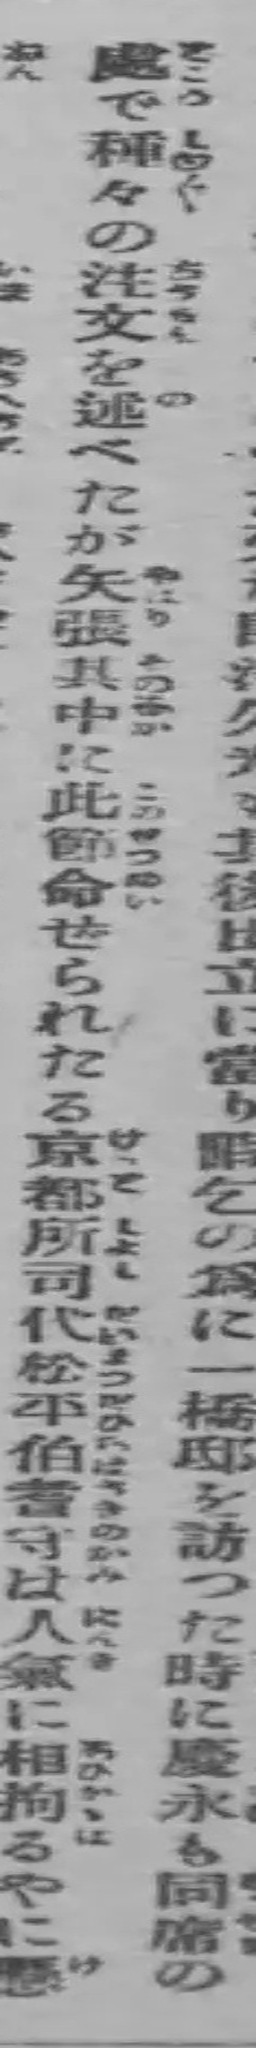処で種々の注文を述べたが矢張其中に此節命ぜられたる京都所司代松平伯耆守は人気に相拘るやに懸
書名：豊橋市史談
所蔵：国立国会図書館 National Diet Library, JAPAN
